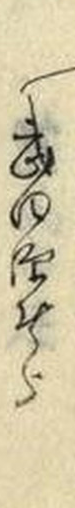武田源次郎

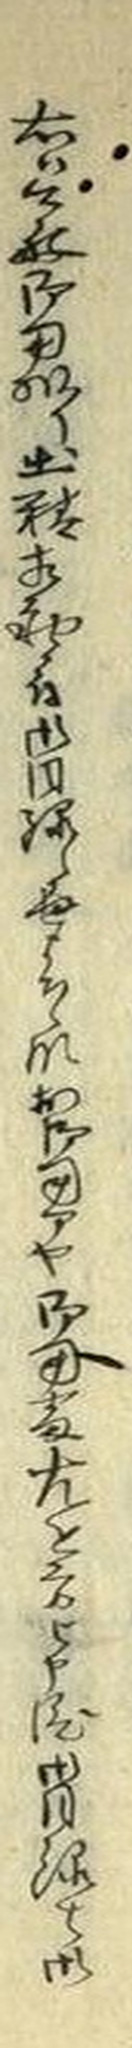右ハ今般御用掛り出精相勤候ニ付御目録之通被下候於御用部屋御用番左近方被申渡御目録者御
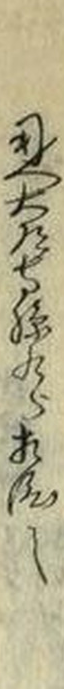用人大道寺孫九郎相渡之
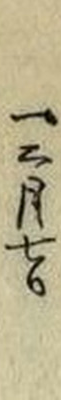一二月七日
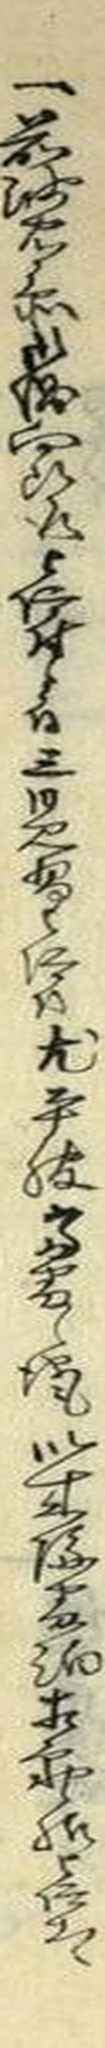一前波忠兵衛御側向頭取被仰付候ニ付三日見習被仰付尤平服当番之儀も以来隔番泊相勤候様被仰出候
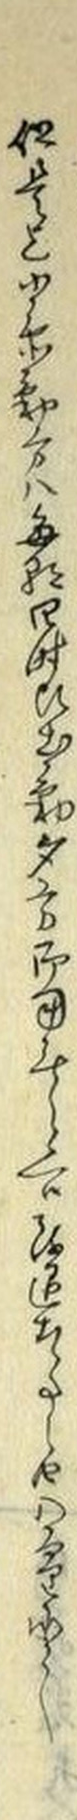但是迄小兵衛勤方ハ毎朝四時頃出勤夕方御用無之候ヘハ致退出候事之由八百里承之
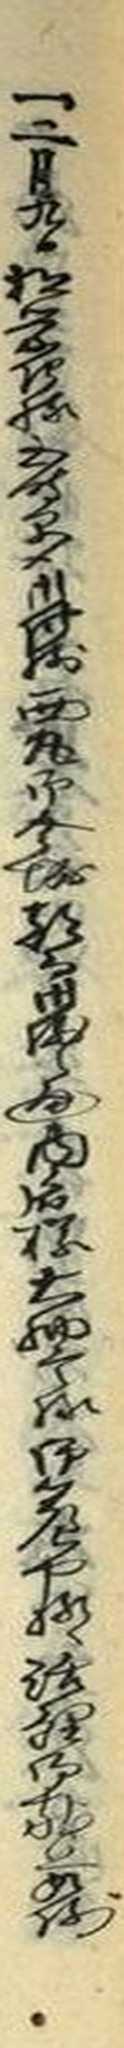一二月九日松栄院様五時早メ御供揃西丸御登城都而御例之通内府様大納言様御簾中様へ活鯉御献上如例
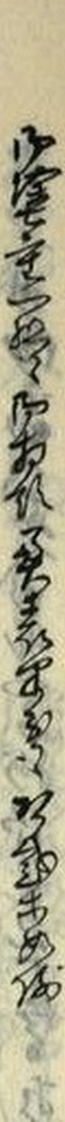御塗重一組ツヽ御拝領奥表半分ツヽ頂戴等如例
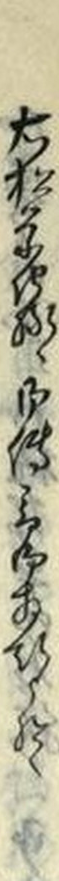右松栄院様へ御伝ニ而御拝領被遊候
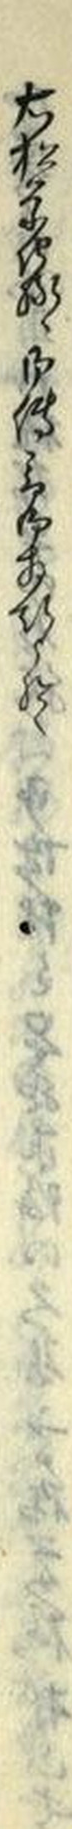右松栄院様へ御伝ニ而御拝領被遊候
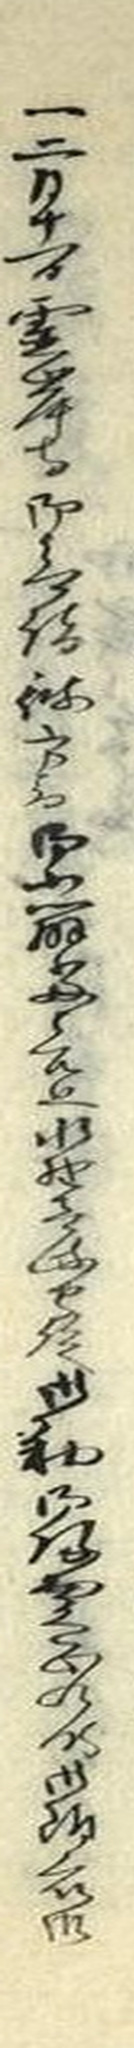一二月十一日霊岸寺御参詣彼方ニ而御小弁当被召上水野壱岐守殿御勤御帰殿正九時御附衆御
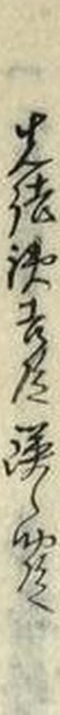先詰鉄吉殿鍈之助殿
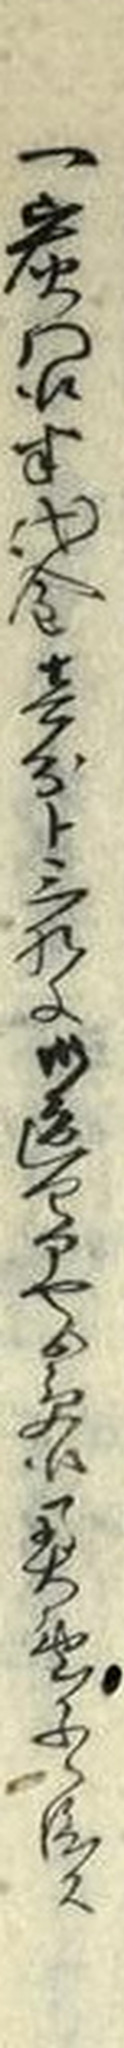一炭八俵半代金壱分ト三拾文御道具部屋ゟ受取奥台子へ渡ス
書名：少傅日録抄（斉善付側向頭取日記、在府）
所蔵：福井県文書館 Fukui Prefectural Archives
